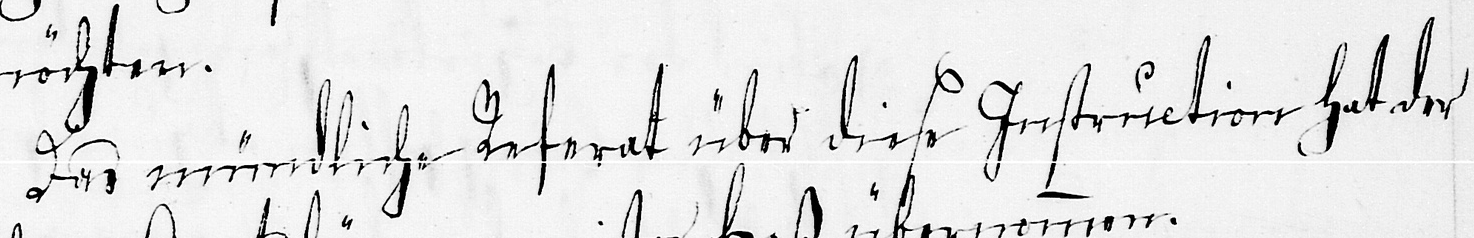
Das mündliche Referat über diese Instruction hat der
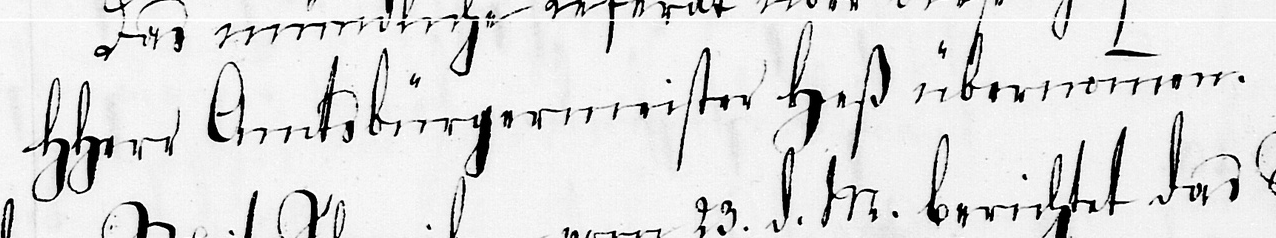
HHerr Amtsbürgermeister Heß übernommen.
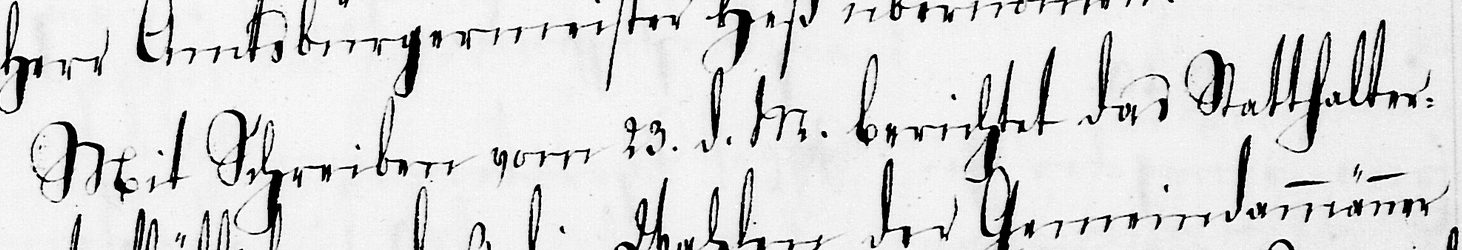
Mit Schreiben vom 23. d. M. berichtet das Statthalter¬
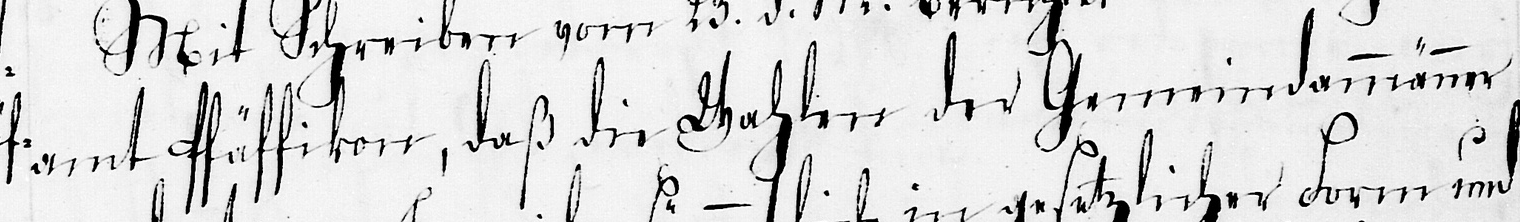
amt Pfäffikon, daß die Wahlen der Gemeindammänner
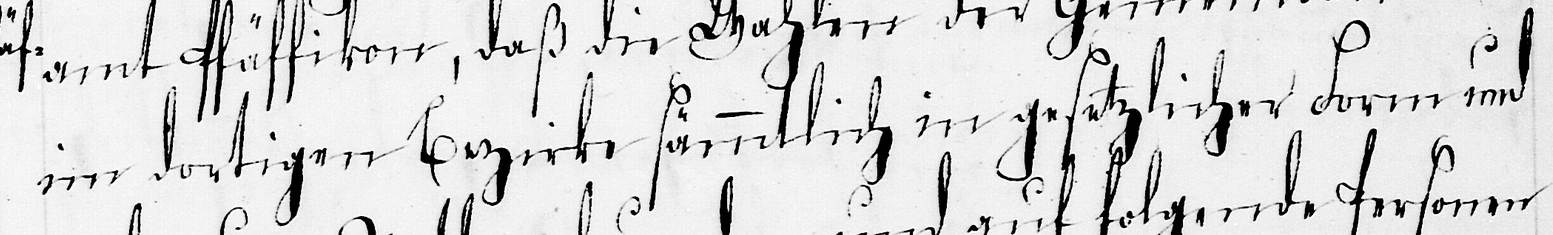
im dortigen Bezirke sämmtlich in gesetzlicher Form und
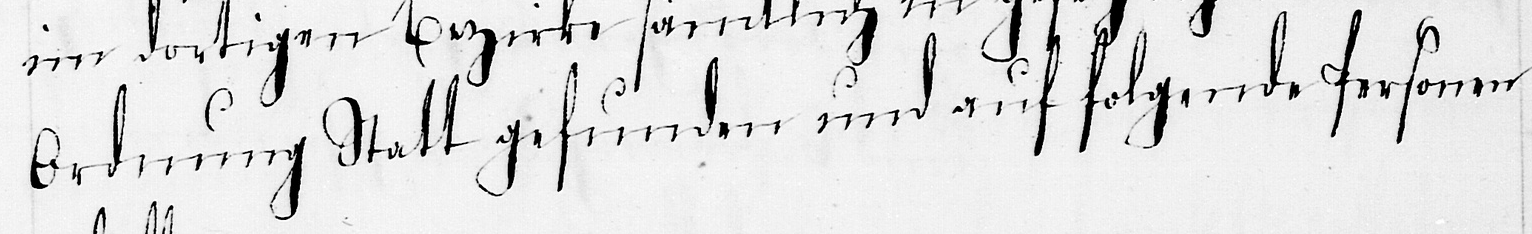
Ordnung Statt gefunden und auf folgende Personen
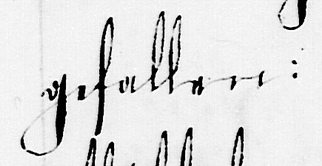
gefallen:
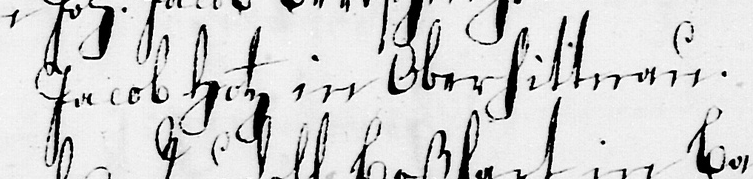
Jacob Hotz in Oberhittnau.
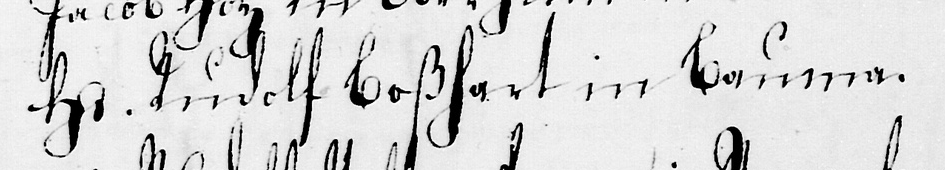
Hs. Rudolf Boßhart in Bauma.
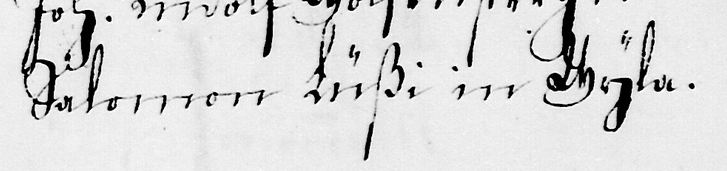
Salomon Lüßi in Wyla.
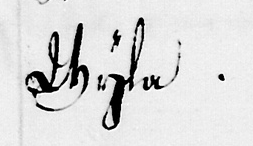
Wyla
